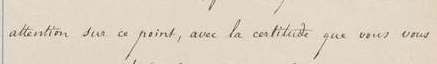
attention sur ce point, avec la certitude que vous vous
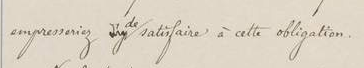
empresseriez d'yde satisfaire à cette obligation.
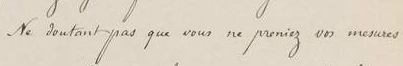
Ne doutant pas que vous ne preniez vos mesures
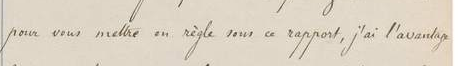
pour vous mettre en règle sous ce rapport, j'ai l'avantage
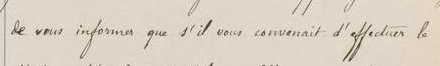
de vous informer que s'il vous convenait d'effectuer le
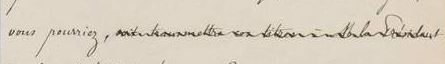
vous pourriez, soit transmettre ces titres à M. le Président
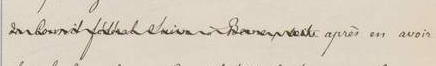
du Conseil fédéral Suisse à Berne, soit après en avoir
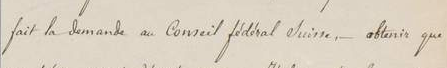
fait la demande au Conseil fédéral Suisse,– obtenir que
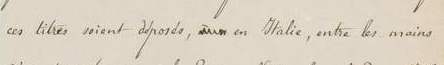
ces titres soient déposés, à un en Italie, entre les mains
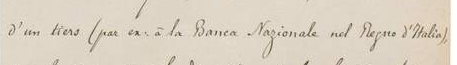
d'un tiers (par ex: à la Banca Nazionale nel Regno d'Italia),
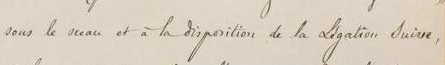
sous le sceau et à la disposition de la Légation Suisse,
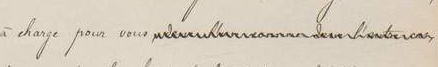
charge pour vous dans l'un comme dans l'autre cas,
